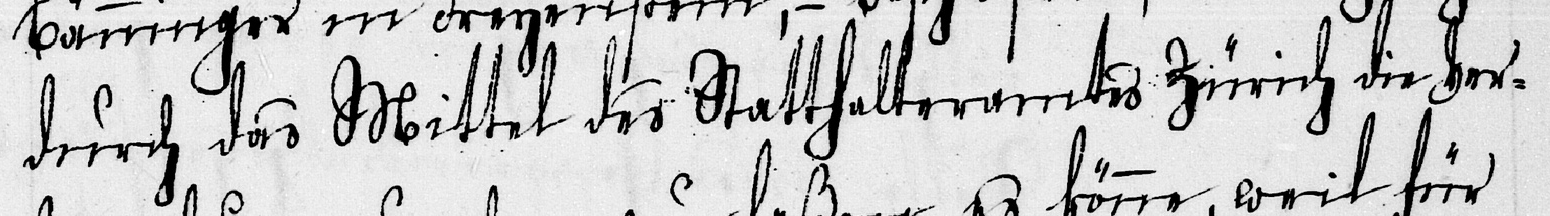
durch das Mittel des Statthalteramtes Zürich die Ver¬
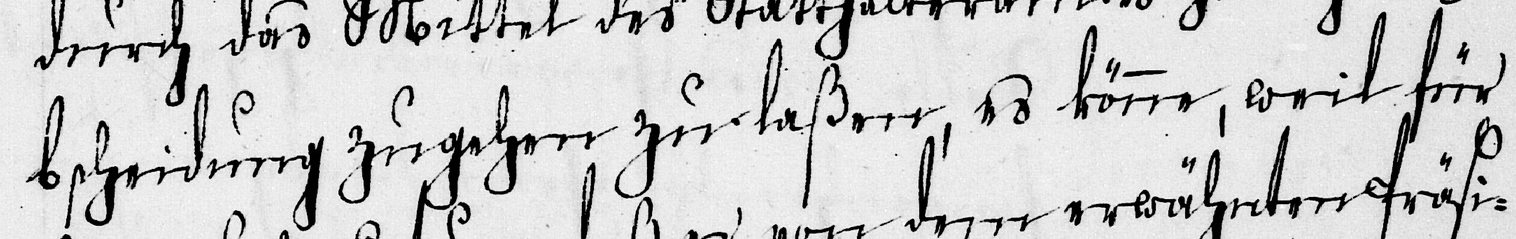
bscheidung zugehen zu laßen, es könne, weil für
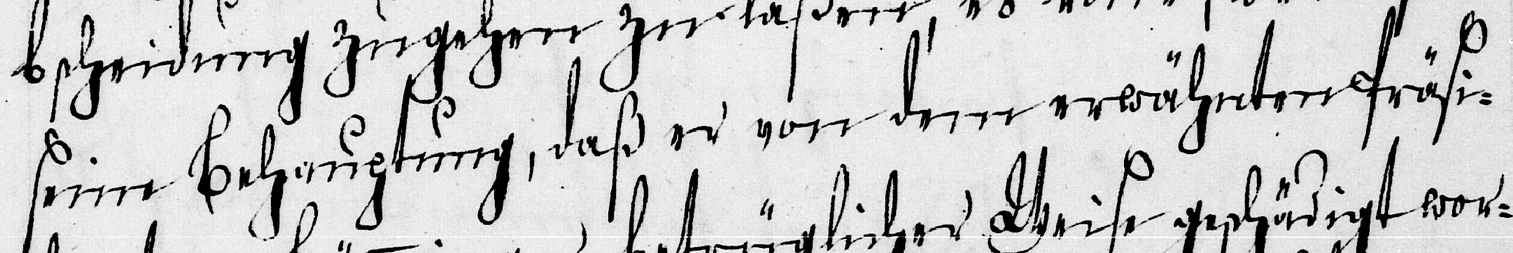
seine Behauptung, daß er von dem erwähnten Präsi¬
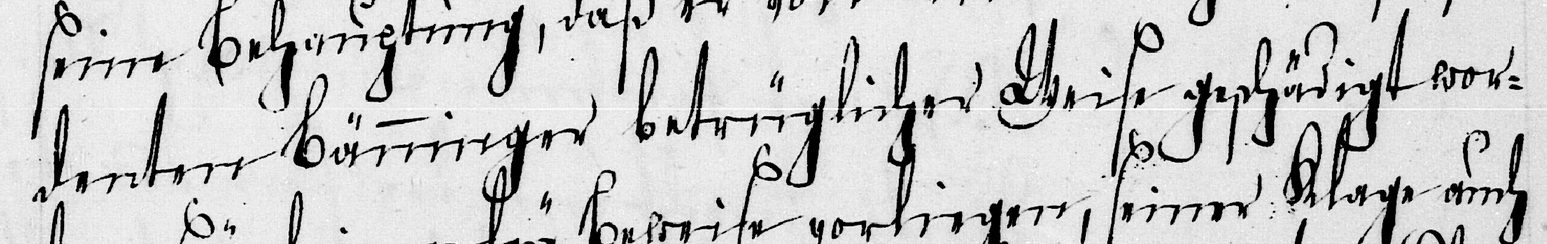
denten Bänninger betrüglicher Weise geschädigt wor¬
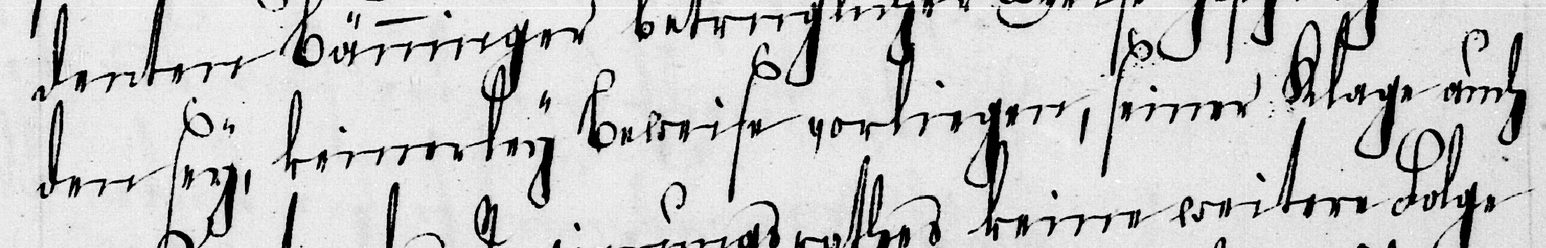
den sey, keinerley Beweise vorliegen, seiner Klage auch
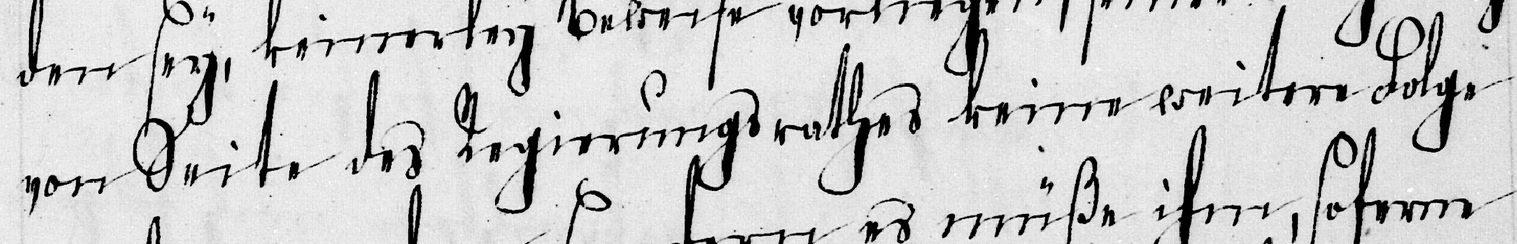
von Seite des Regierungsrathes keine weitere Folge
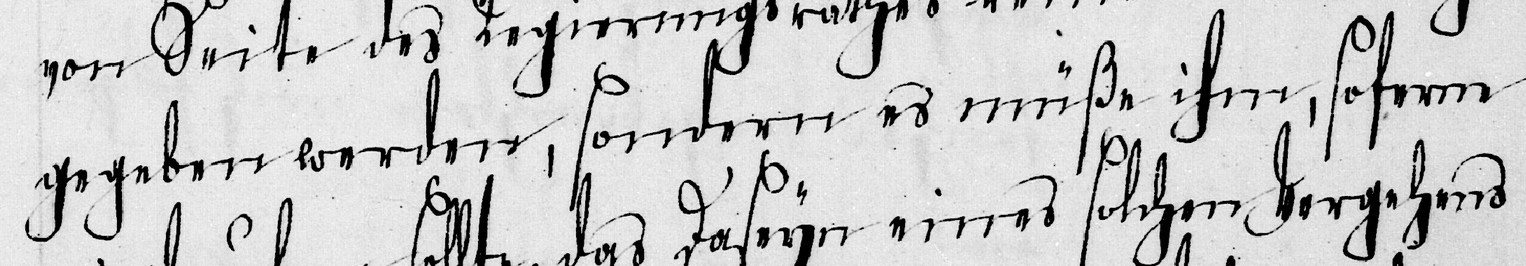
gegeben werden, sondern es müße ihm, soferne
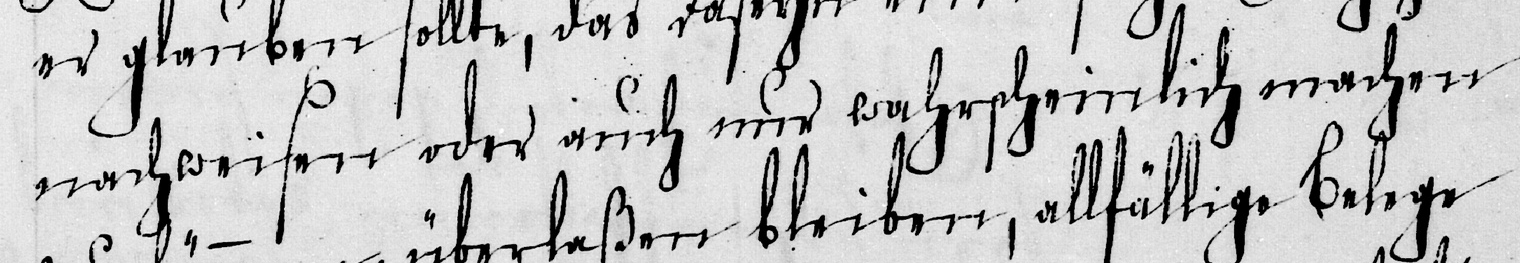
nachweisen oder auch nur wahrscheinlich machen
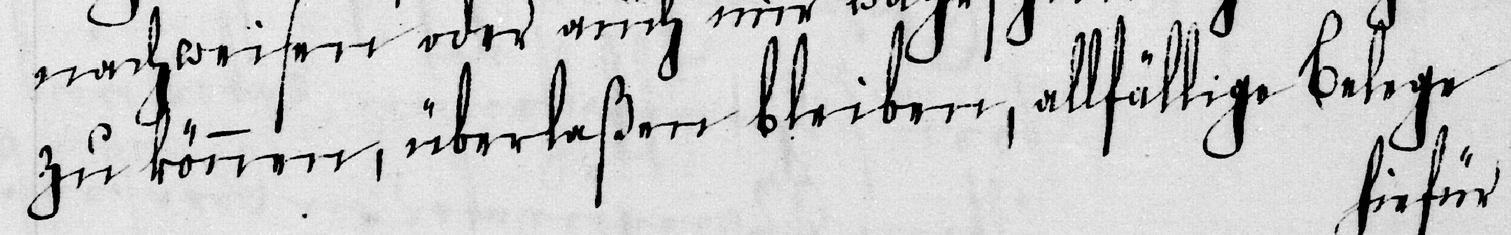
zu können, überlaßen bleiben, allfälligen Belege
